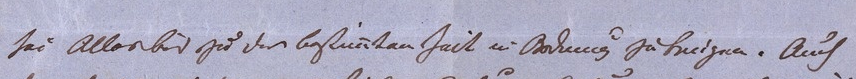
sei Alles bis zu der bestimmten Zeit in Ordnung zu bringen. Auch
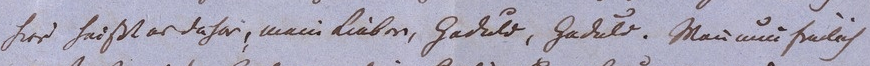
hier heißt es daher, mein Lieber, Geduld, Geduld. Wenn nun freilich
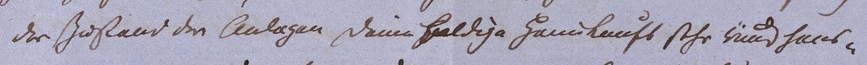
der Zustand der Anlagen Deine baldige Heimkunft sehr wünschens-
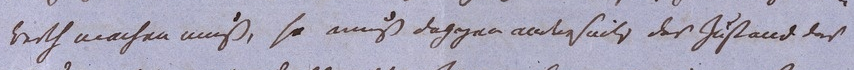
werth machen muß, so muß dagegen andrerseits der Zustand des
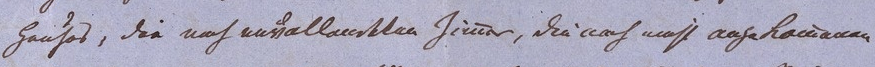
Hauses, die noch unvollendeten Zimmer, die noch nicht angekommenen
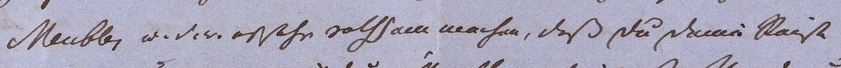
Meubles u. s. w. es sehr rathsam machen, daß Du Deine Reise
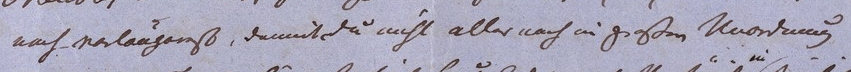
noch verlängerst, damit Du nicht alles noch in großer Unordnung
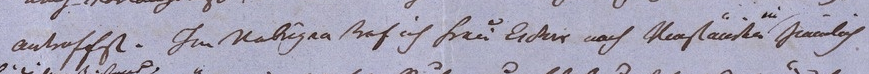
antreffst. Im Uebrigen traf ich Frau Escher nach Umständen in ziemlich
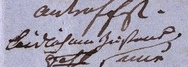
leidlichem Zustand,
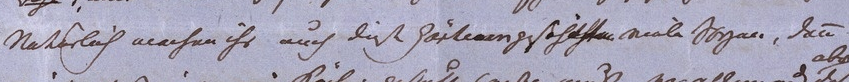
Natürlich machen ihr auch diese Gärtnergeschichten viele Sorgen, dann
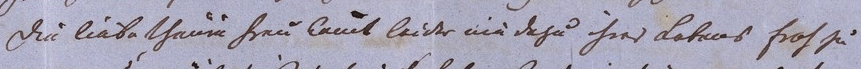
Die liebe theure Frau kommt leider nie dazu ihres Lebens froh zu
